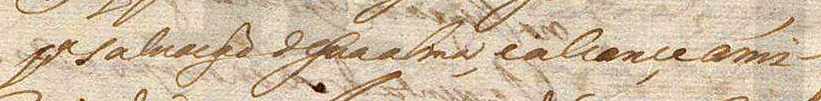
pa saluaçaõ de sua alma, e alcance a mi
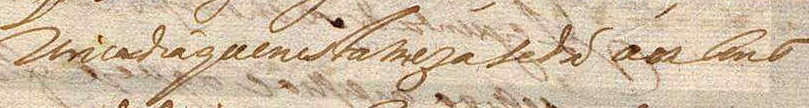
Zericodia que nesta meza se da aos bons
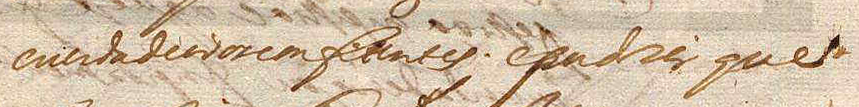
e uerdadeiros confitentes. e por dizer que
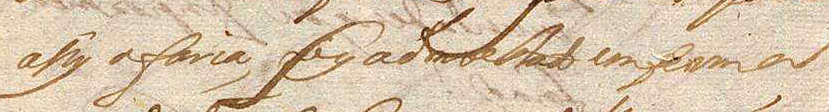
assy o faria, foy admoestado em forma
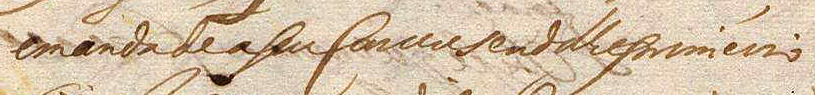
e mandado a seu Carcere sendolhe primeiro
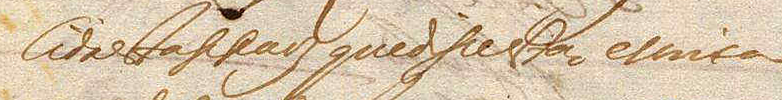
lida esta sessaõ que disse esta escrita
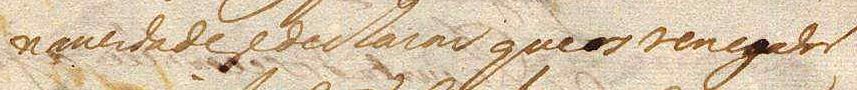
na uerdade e declarou que os renegados
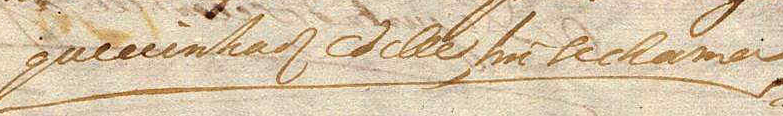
que uinhaõ cō elle hū se chama
